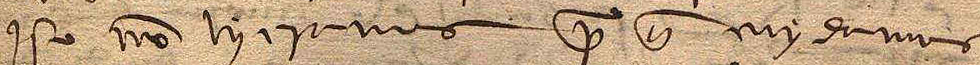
Jso n̄o vyeramos p̄oq̄ cuydamos
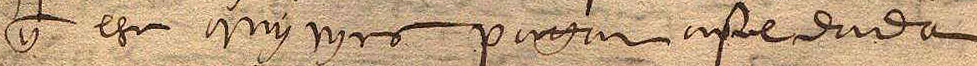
q̄ lhe quyryes pagar a soldada
